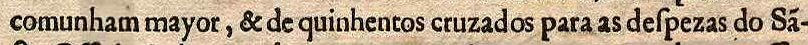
comunham mayor, & de quinhentos cruzados para as despezas do Sā
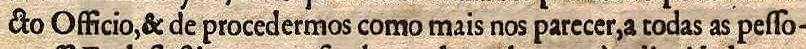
cto Officio, & de procedermos como mais nos parecer, a todas as pesso
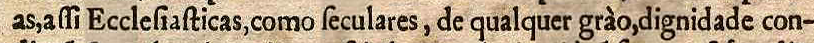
as, assi Ecclesiasticas, como seculares, de qualquer grào, dignidade con
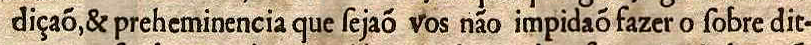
diçaõ, & preheminencia que sejaõ vos naõ impidaõ fazer o sobredit
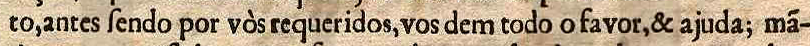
to, antes sendo por vòs requeridos, vos dem todo o favor, & ajuda; mā
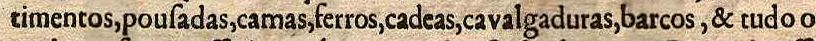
timentos, pousadas, camas, ferros, cadeas, cavalgaduras, barcos, & tudo o
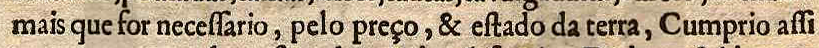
mais que for necessario, pelo preço, & estado da terra, Cumprio assi
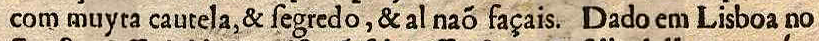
com muyta cautela, & segredo, & al naõ façais. Dado em Lisboa no
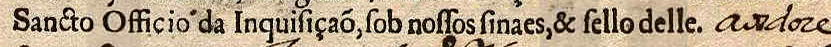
Sancto Officio da Inquisiçaõ, sob nossos sinaes, & sello delle. aos doze
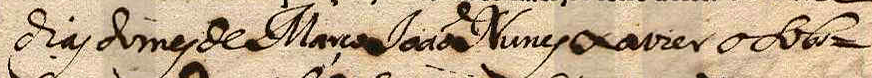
dias do mes de Março Joaõ Nunes Xavier o sobs
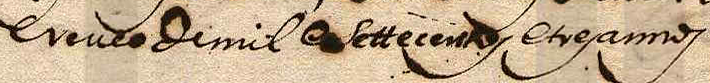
creueo de mil e settecentos e tres annos
